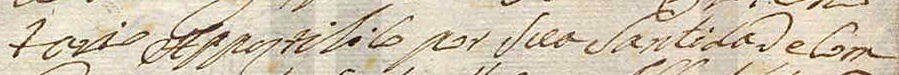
torio Appostilico por sua santidade com
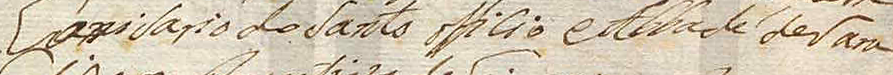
Comisario do Santo officio e Abbade de Sam
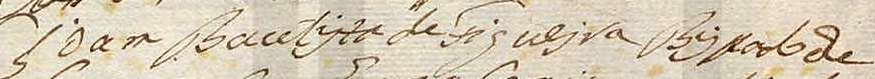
Ioam Bautista de Figuejra Bispado de
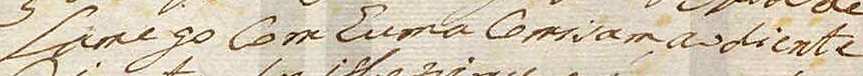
Lamego com huma Comisam, aodiente
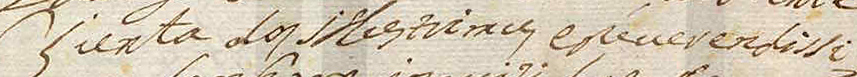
Junta dos illustrimos e reuerendissi
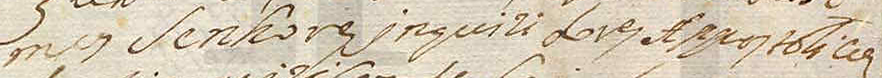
mos Senhores jnquizidores Appostolicos
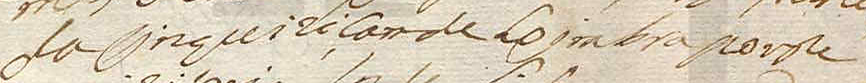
da jnquiziçam de Cojmbra por Re
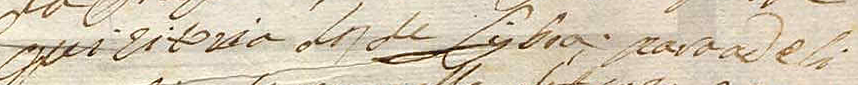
quizitoria desde Lisboa; para a deli
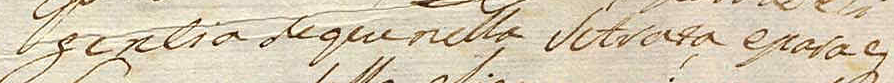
gencia de que nella se trata e para es
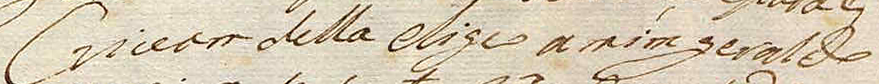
Criuam della digo a mim geraldo
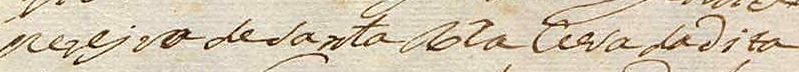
perejra de santa Roza cura da dita
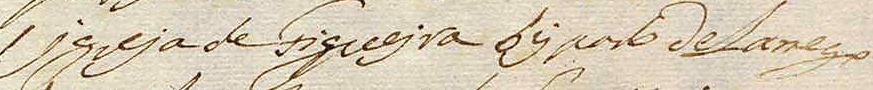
jgreja de Figueira bispado de Lamego
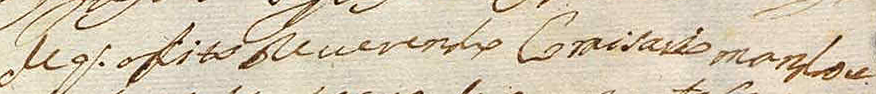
de q̄. o dito Reuerendo Comisario mandou
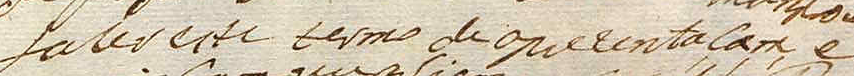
fazer este termo de aprezentaçam, e
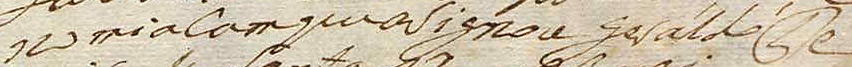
nomiacam que asignou geraldo Pe
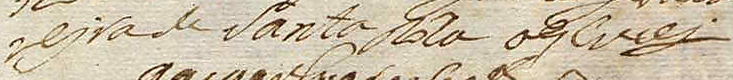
rejra de Santa Roza o escreuj
